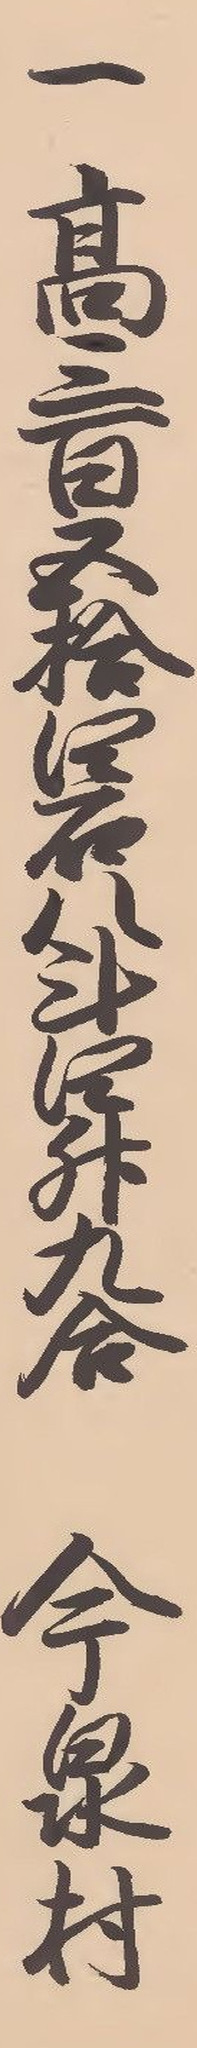一高三百五拾四石八斗四升九合今泉村
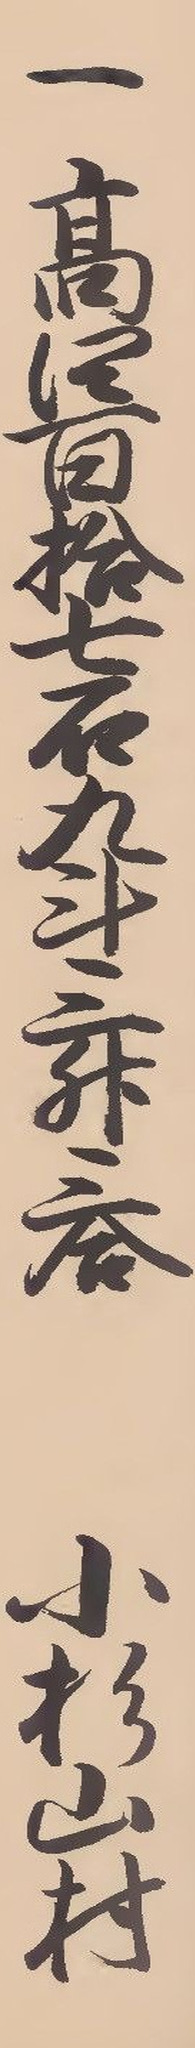一高四百拾七石九斗三升三合小杉山村
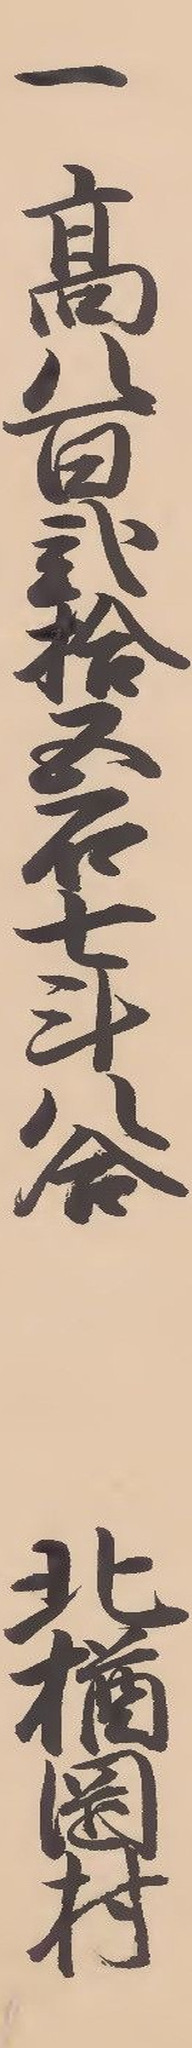一高八百弐拾五石七斗八合北楢岡村
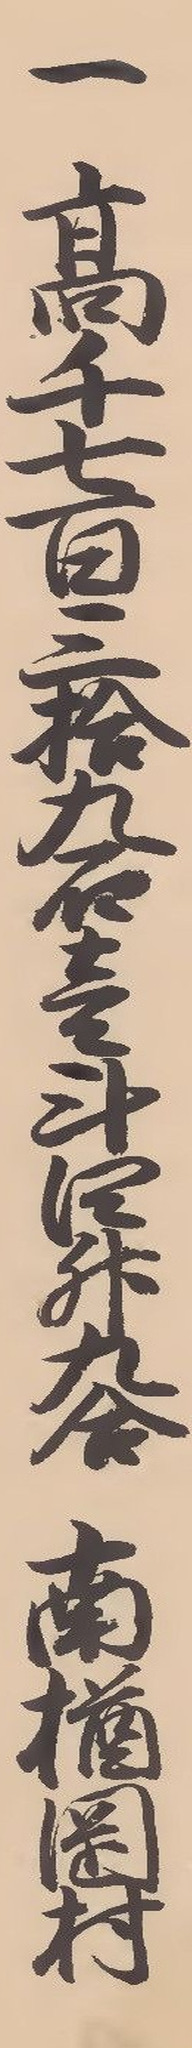一高千七百三拾九石壱斗四升九合南楢岡村
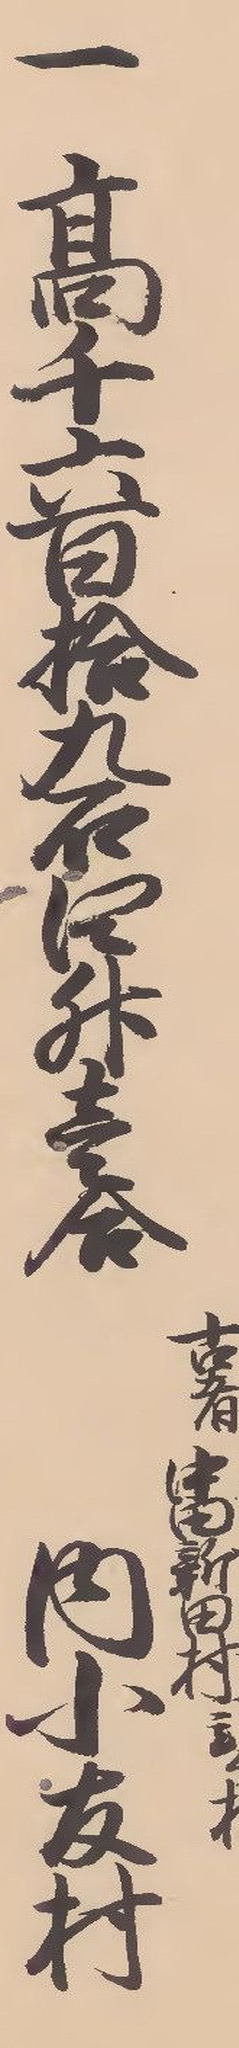一高千六百拾九石四升壱合内小友村

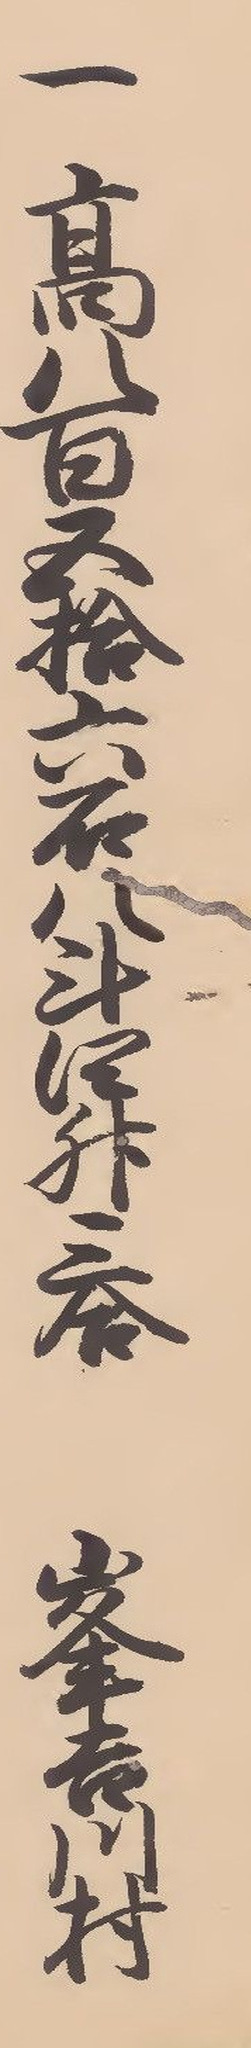一高八百五拾六石八斗四升三合峰吉川村
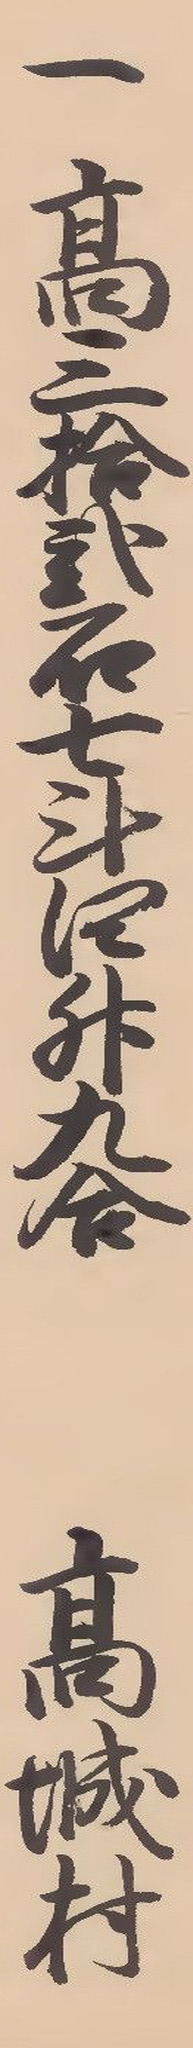一高三拾弐石七斗四升九合高城村
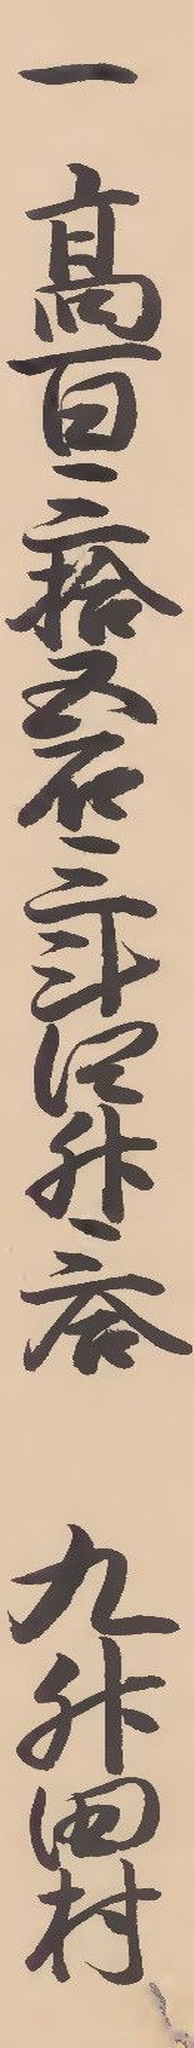一高百三拾五石三斗四升三合九升田村
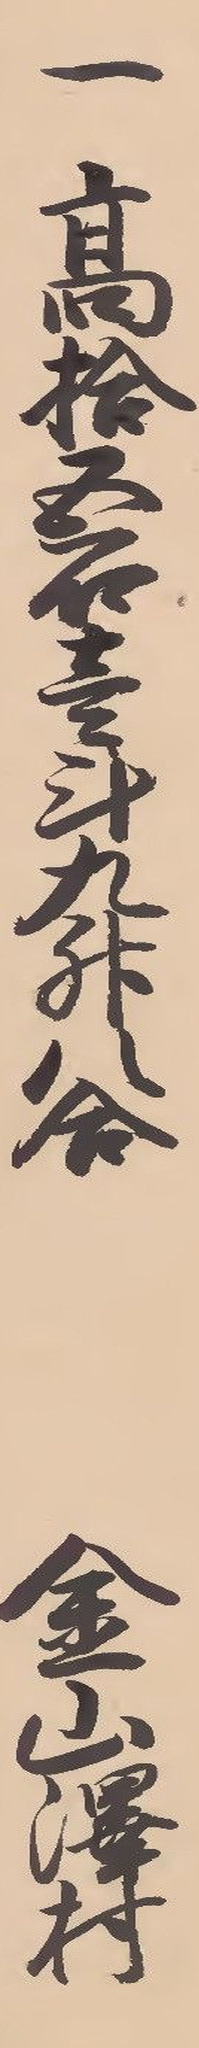一高拾五石壱斗九升八合金山沢村
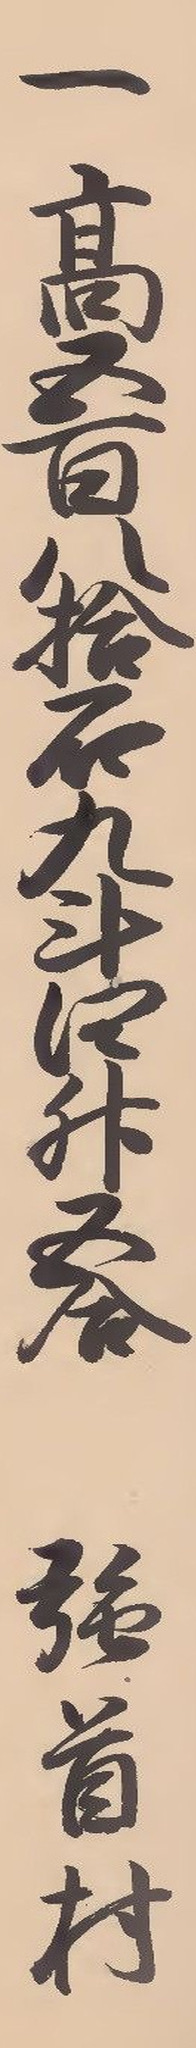一高五百八拾石九斗四升五合強首村
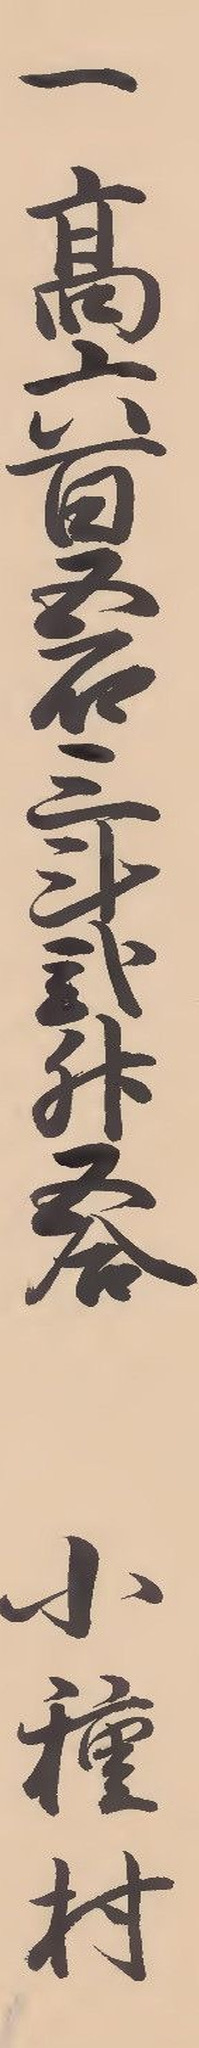一高六百五石三斗弐升五合小種村
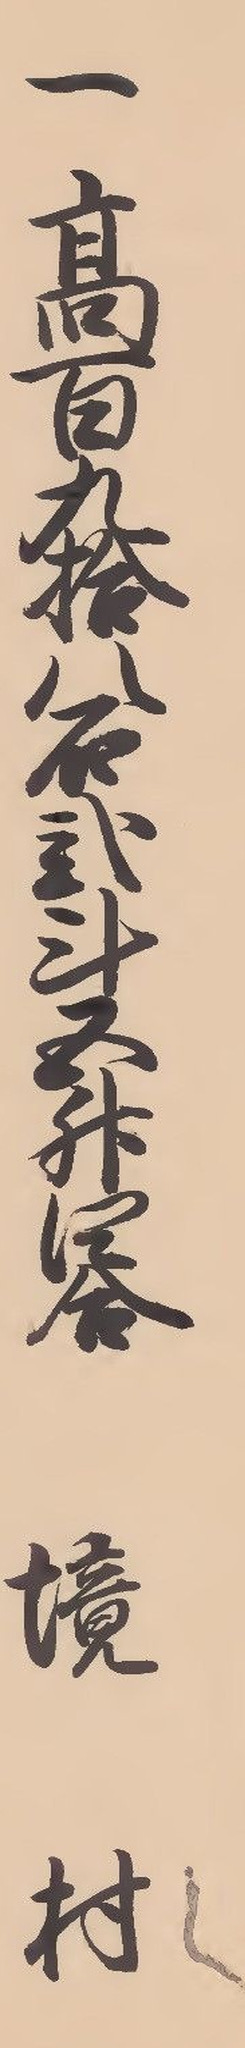一高百九拾八石弐斗五升四合境村
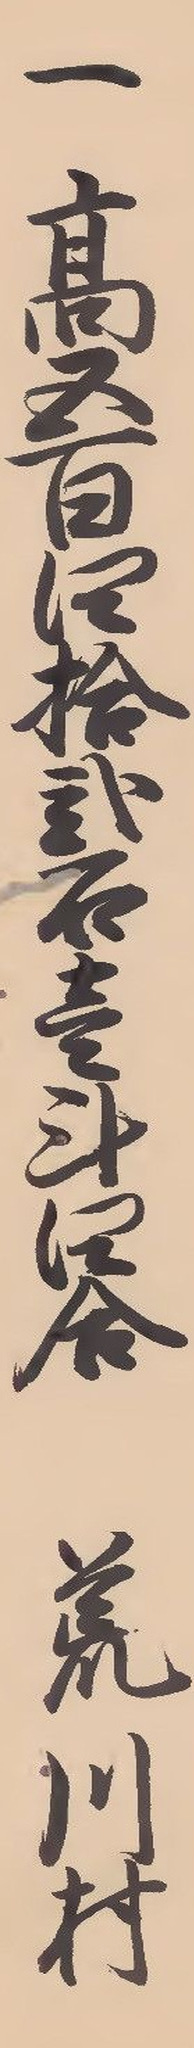一高五百四拾弐石壱斗四合荒川村

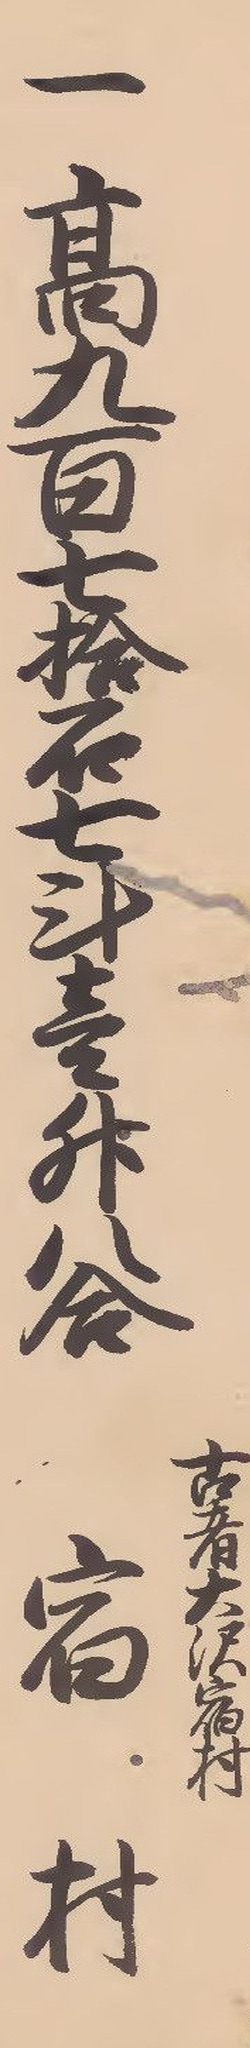一高九百七拾石七斗壱升八合宿村
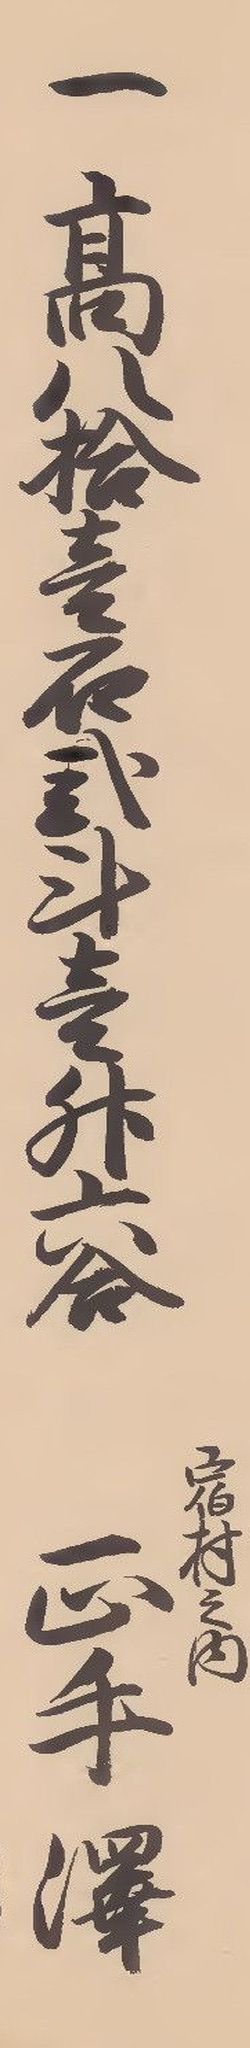一高八拾壱石弐斗壱升六合正手沢
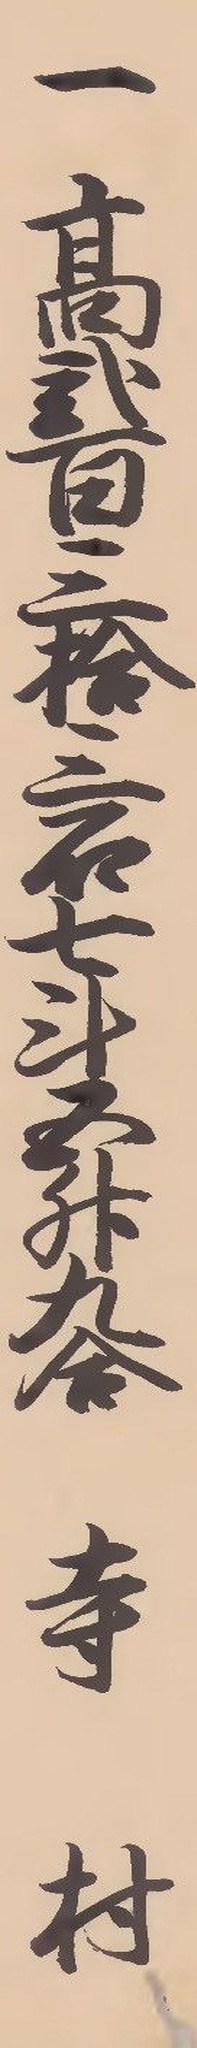一高弐百三拾三石七斗五升九合寺村
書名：出羽国郷帳　５
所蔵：国立公文書館 National Archives of Japan
